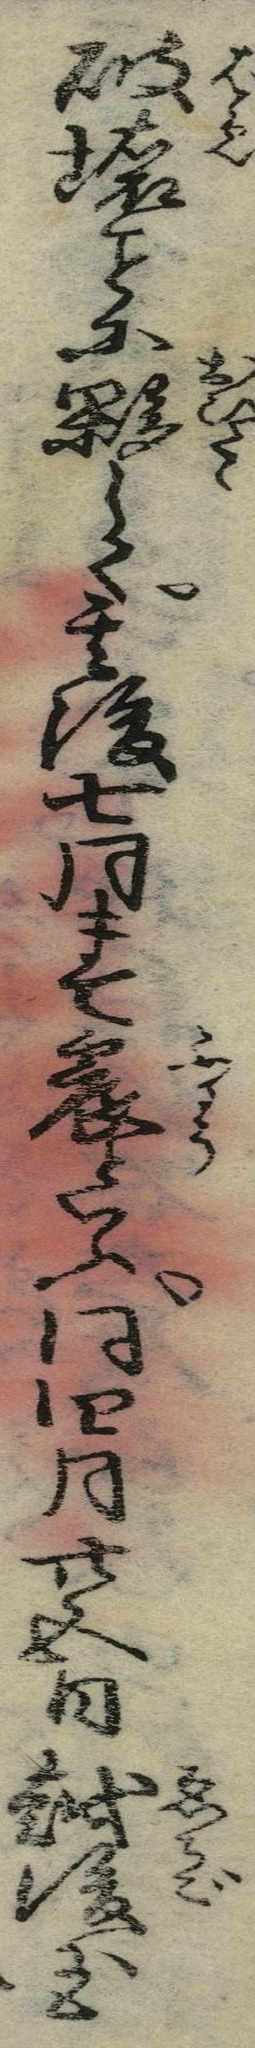破壊ことに夥しく。其後七月まて震といふ。同四月廿五日越後国
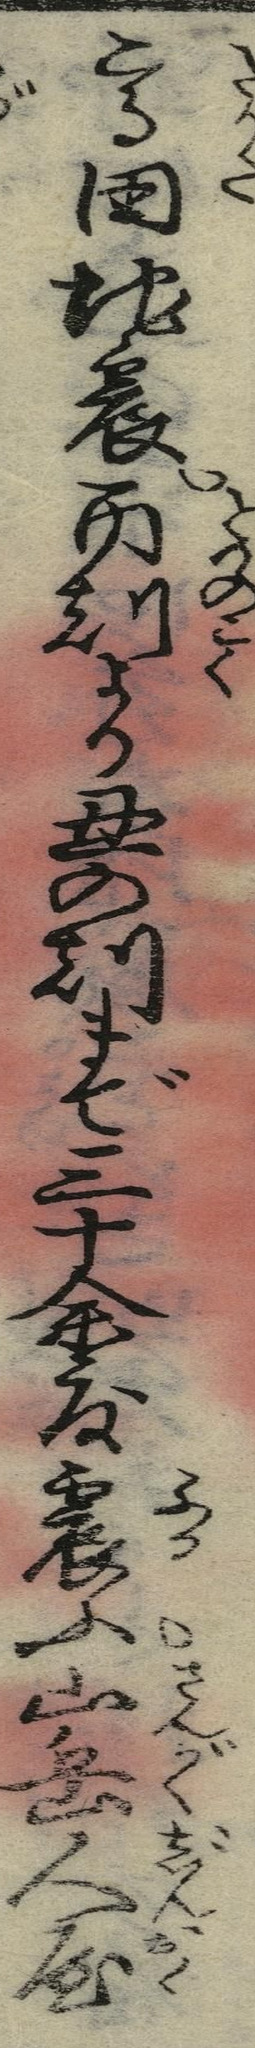高田地震。酉刻より丑の刻まで三十余度震ふ。山岳人屋
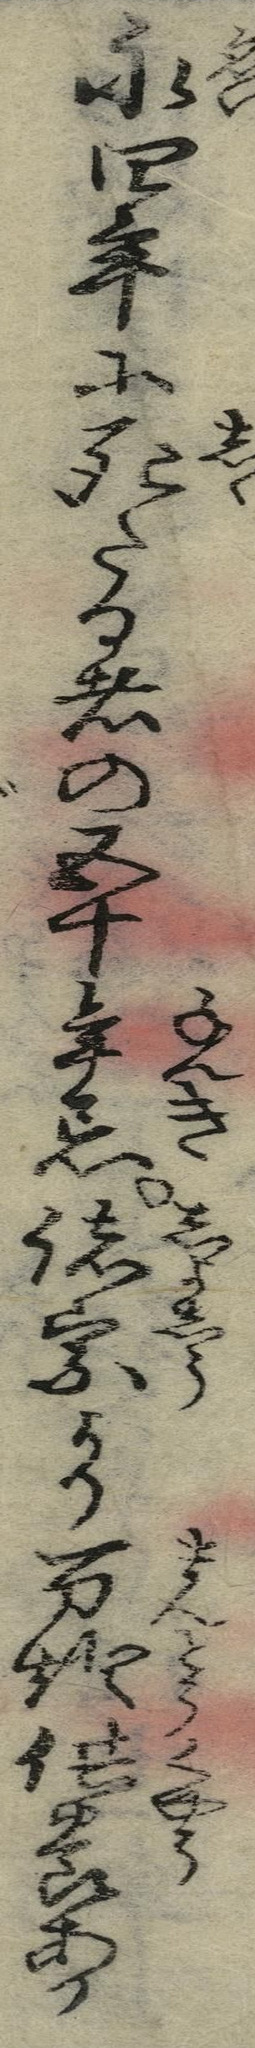永四年に死たる者の五十年忌。諸宗より万灯供養あり
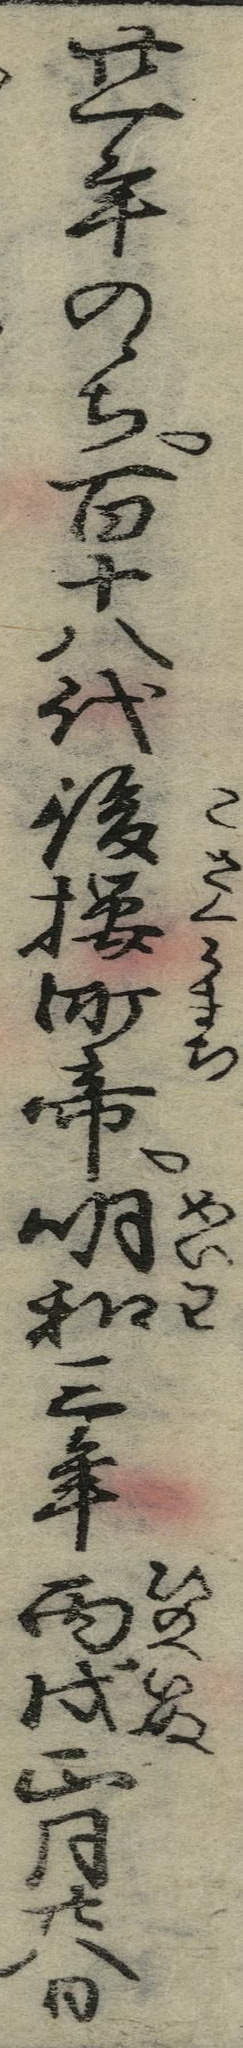廿一年のゝち。百十八代後桜町帝。明和三年丙戌正月廿八日
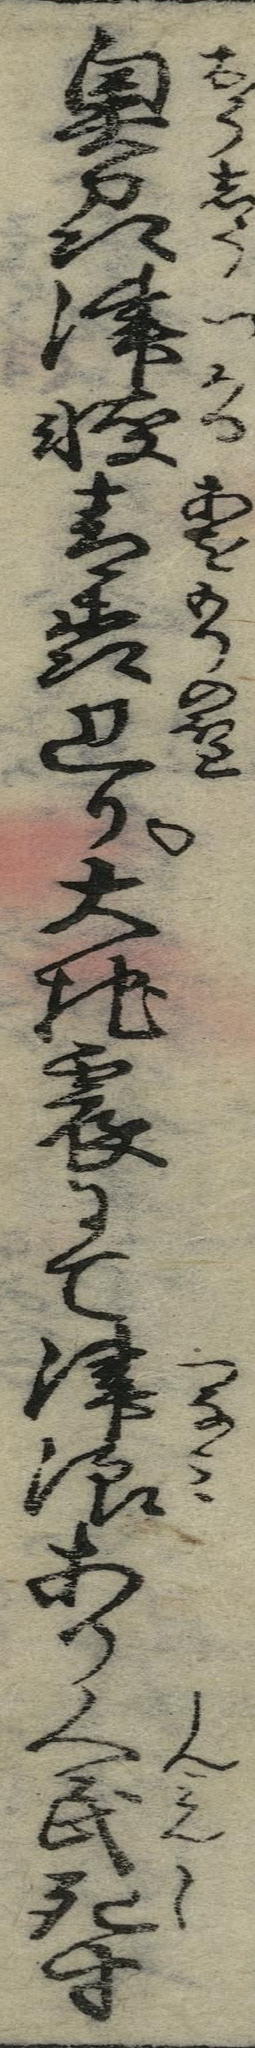奥州津軽青森辺り。大地震にて津浪あり人民死す

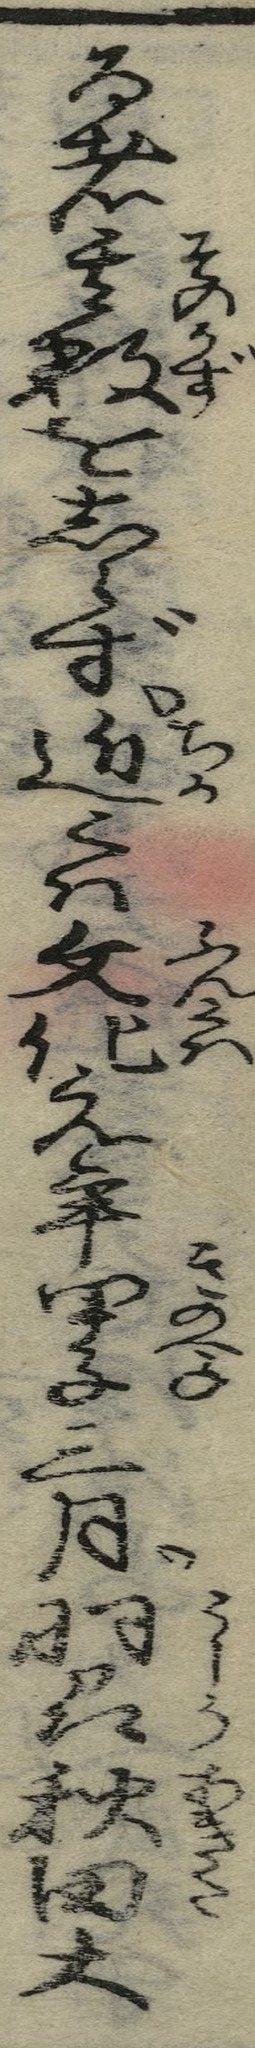る者其数をしらず。近くは文化元年甲子三月。羽州秋田大
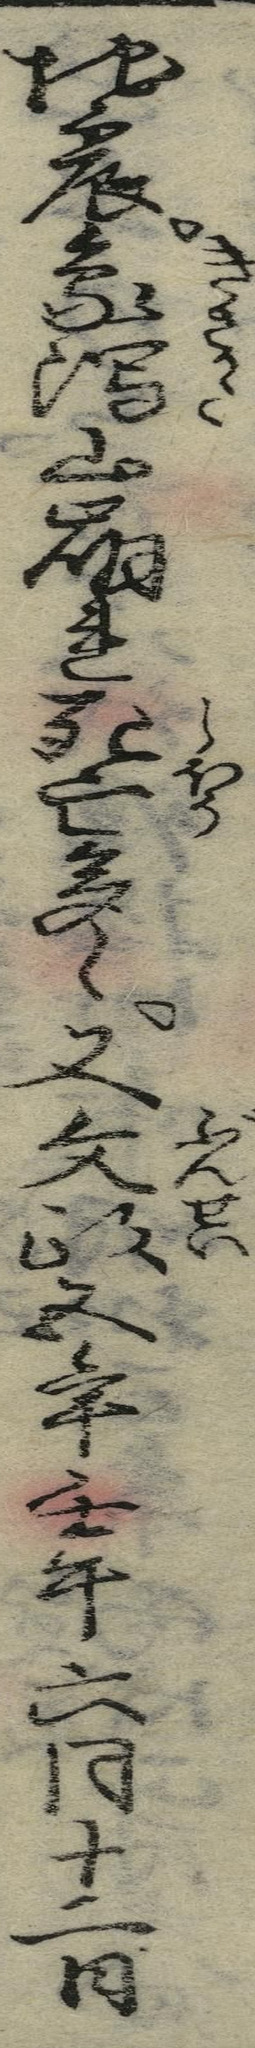地震。象潟山崩れ死亡多し。又文政五年壬年六月十二日
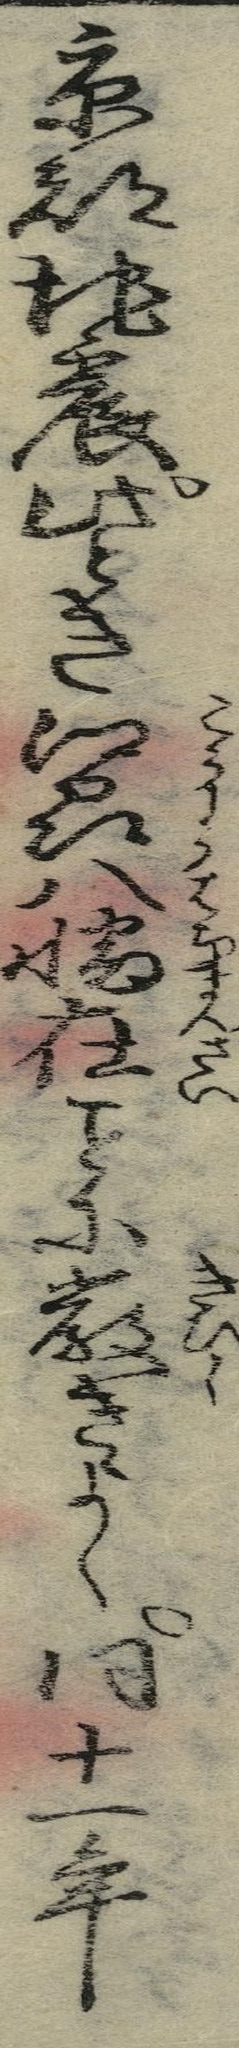京都地震。此とき江州八幡在ことに厳きよし。同十一年
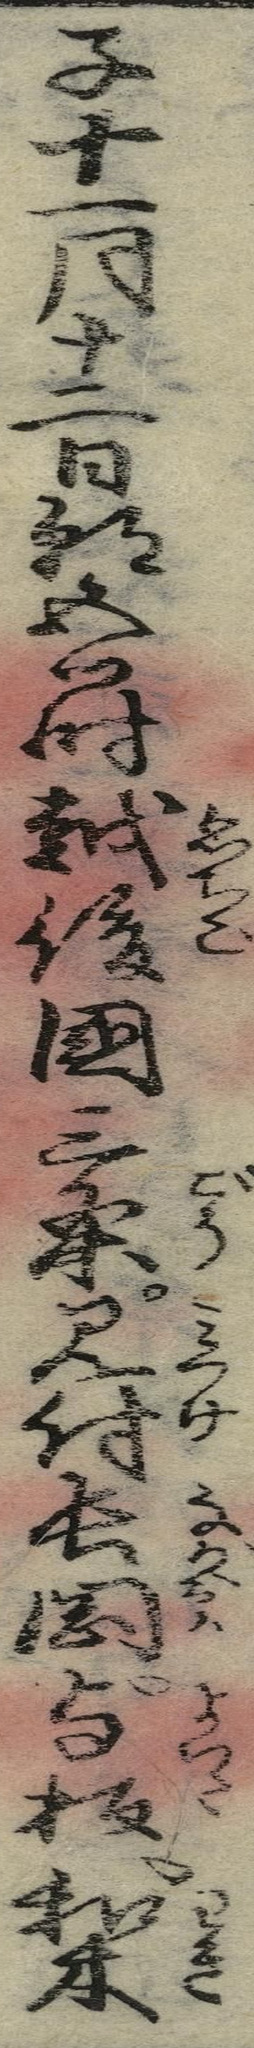子十一月十二日明五つ時越後国三条。見付長岡。与板。和木
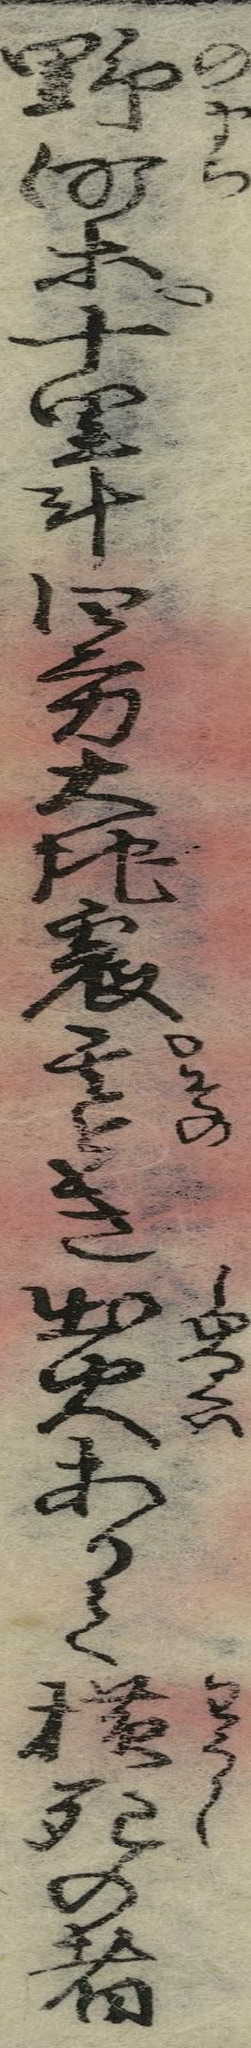野町等。十里斗四方大地震。其とき出火ありて横死の者
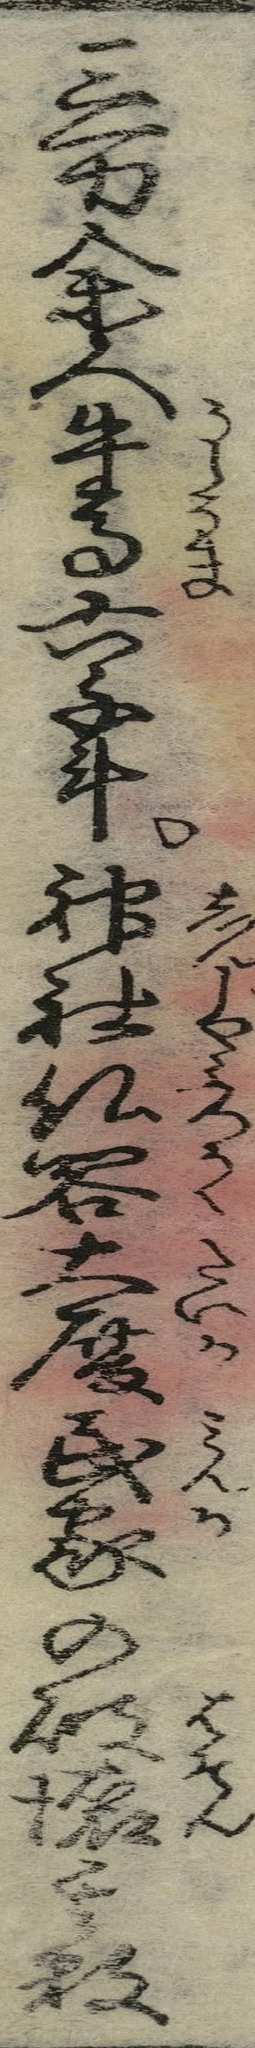三万余人牛車六千斗。神社仏閣大廈民家の破損其数
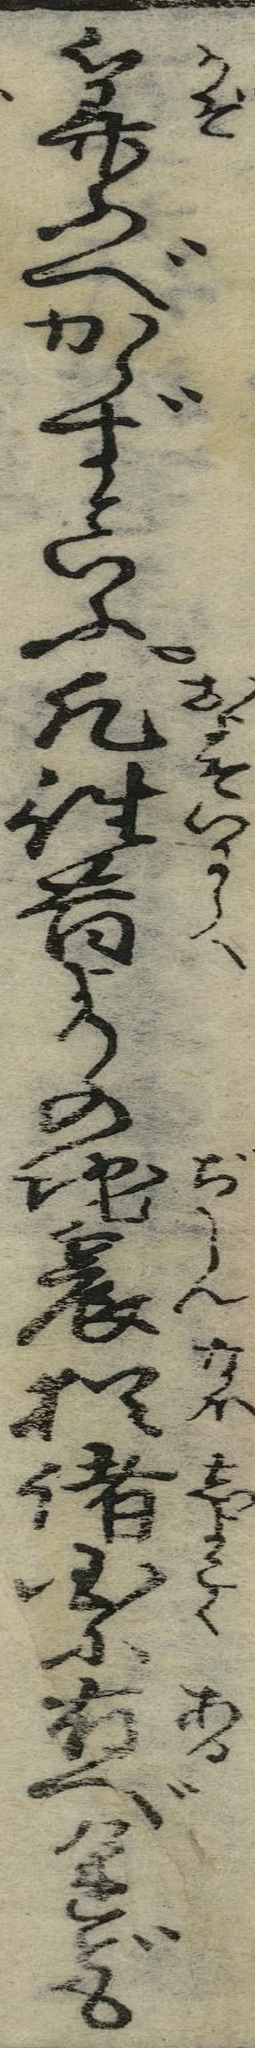算ふべからずといふ。凡往昔よりの地震猶諸国に有べけれども
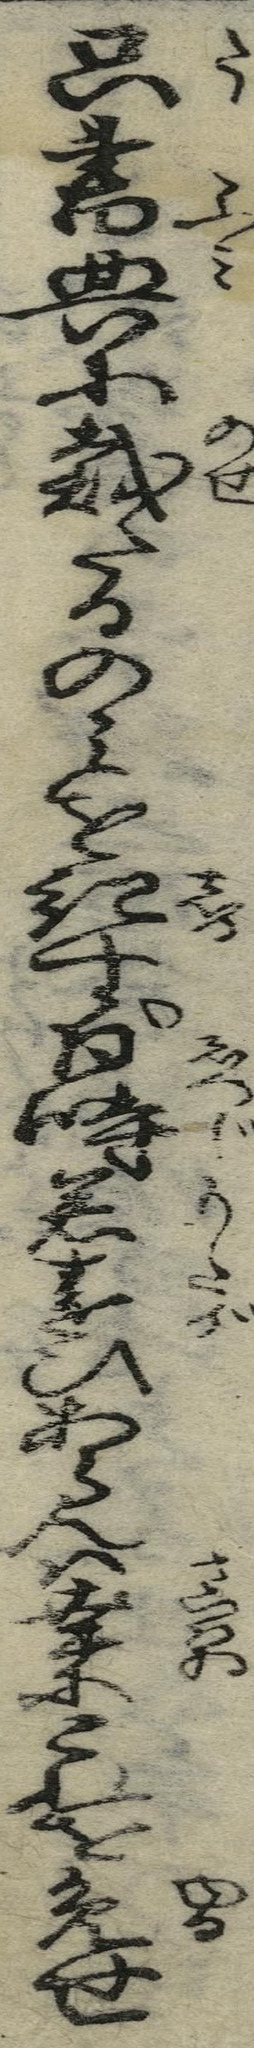只書典に載たるのみを記す。日時若違ひあらんは幸にこれを免せ
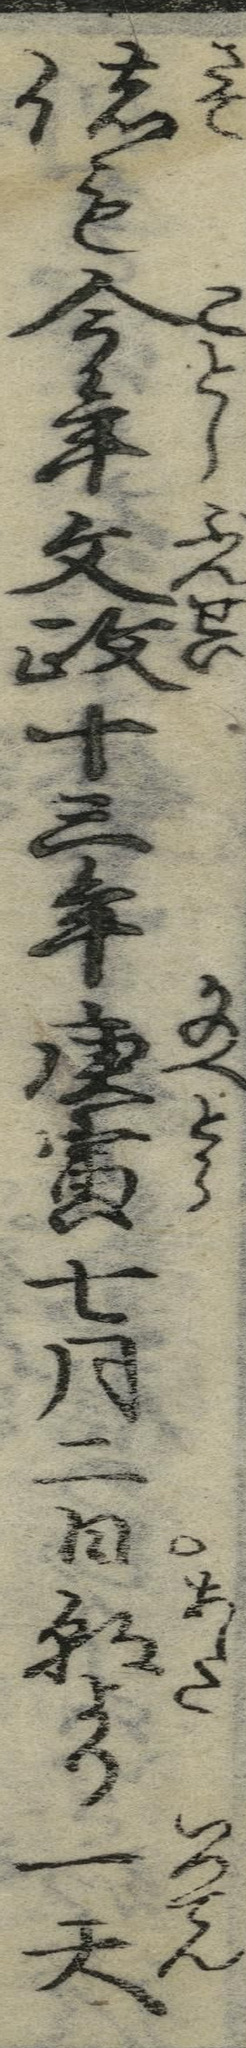偖も今年文政十三年庚寅七月二日。朝より一天
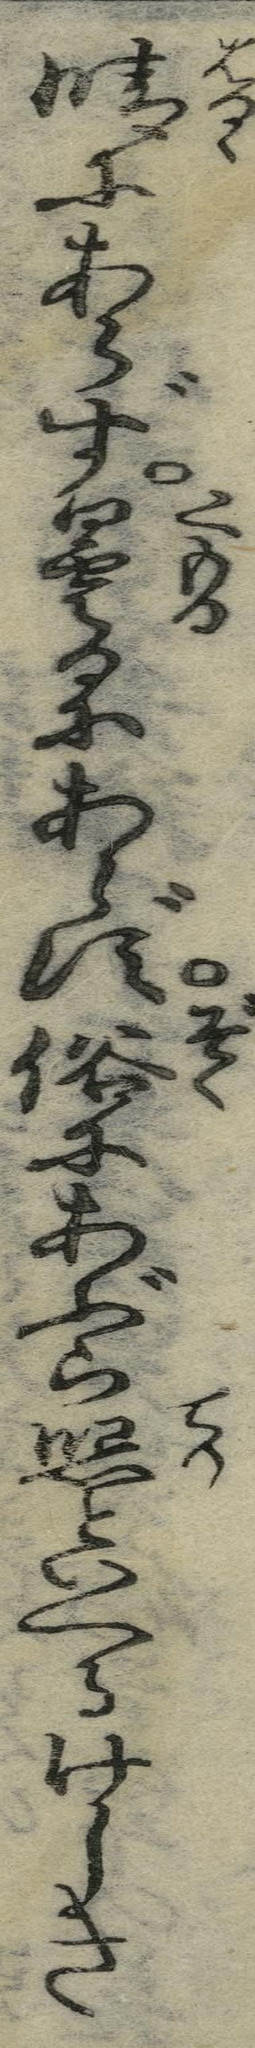晴にあらず。曇るにあらず。俗にあぶら照といへるけしき
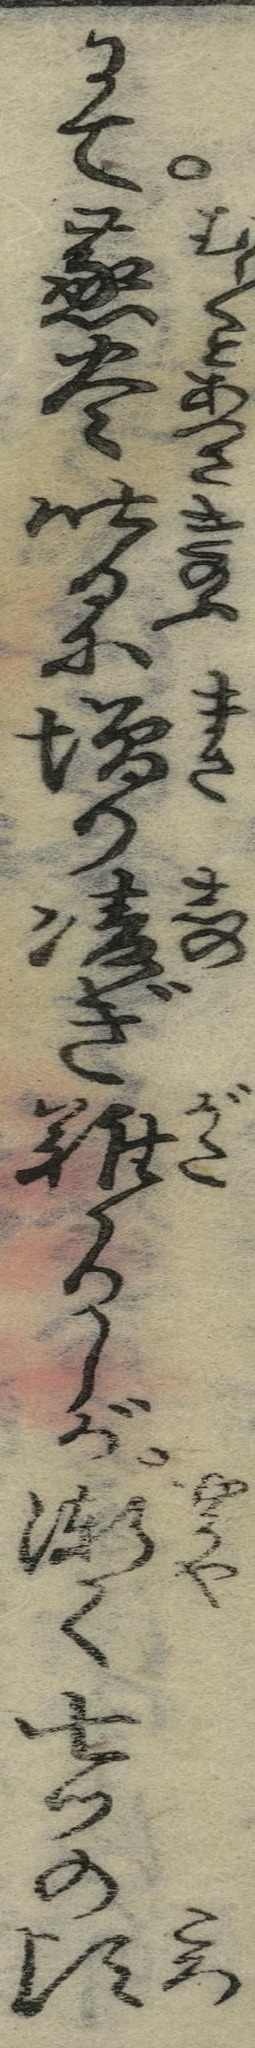にて。蒸炎昨日に増り凌ぎ難りしが。漸く七ツの頃
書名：本朝地震記　全
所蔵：東京大学地震研究所図書室 Earthquake Research Institute Library, The University of Tokyo, JAPAN
